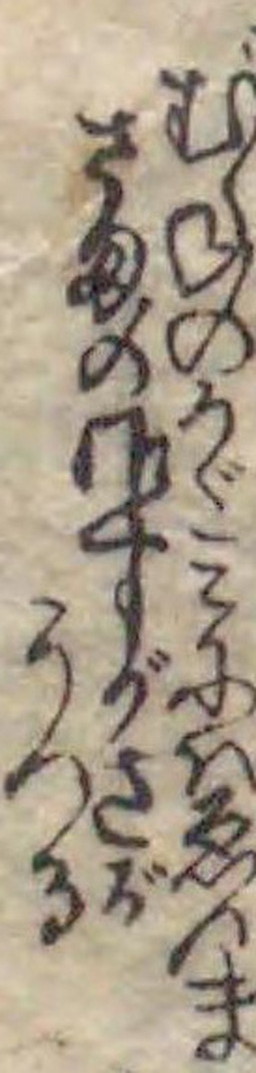さまの御すがたが
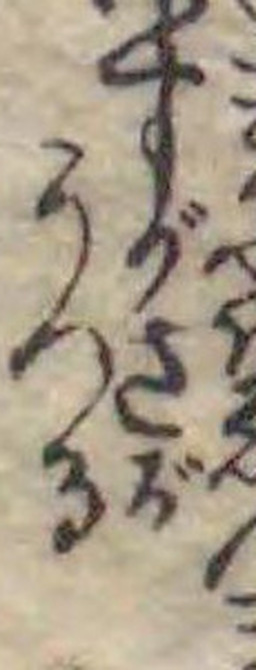うつる

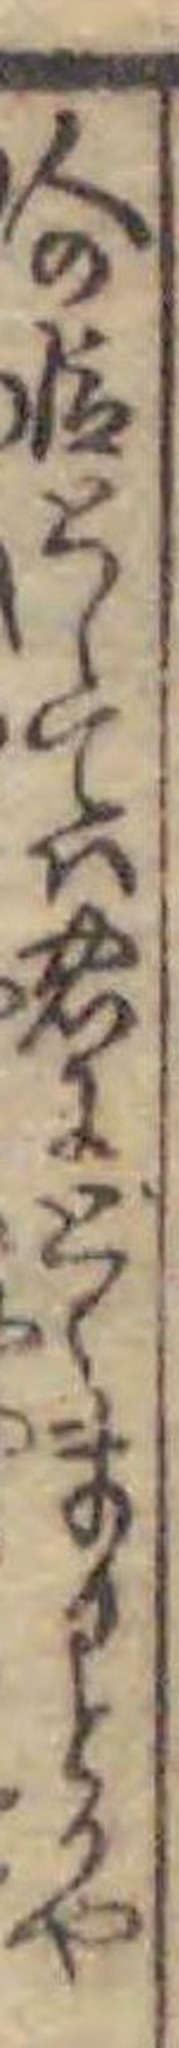人の情としては忠にとゝまるとかや
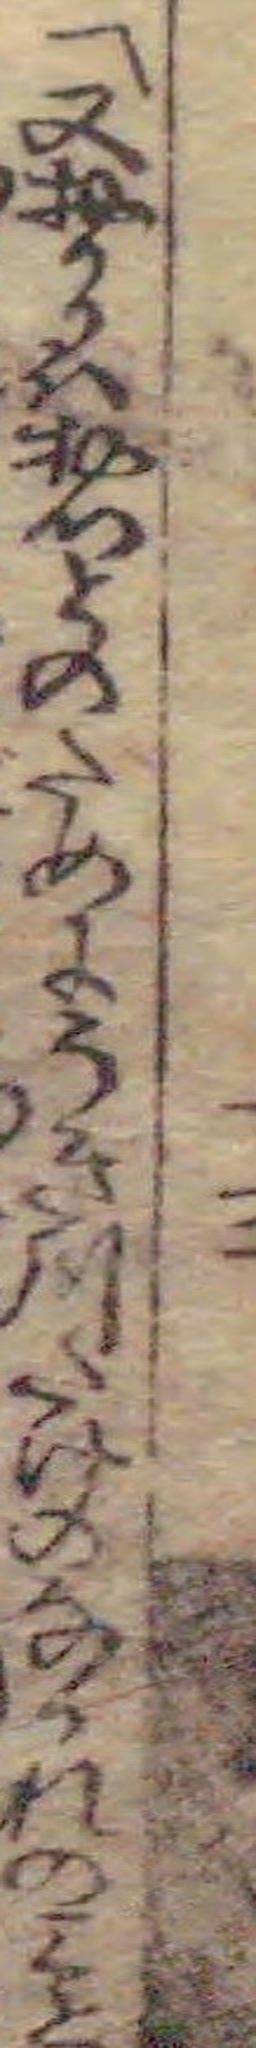〽又おかるはおつとのためにうき川たけのなかれのみと
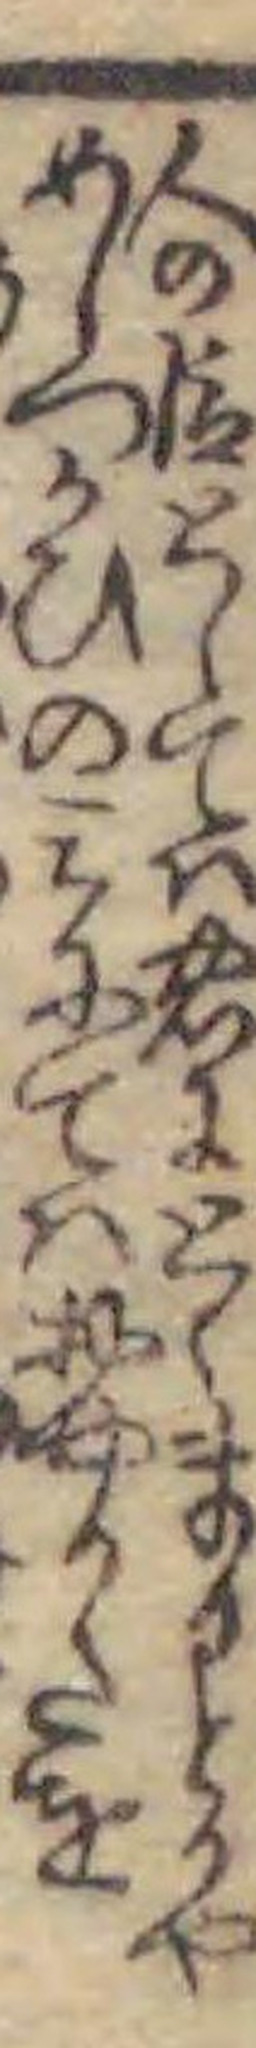めしつかひのみにてはおやかたを
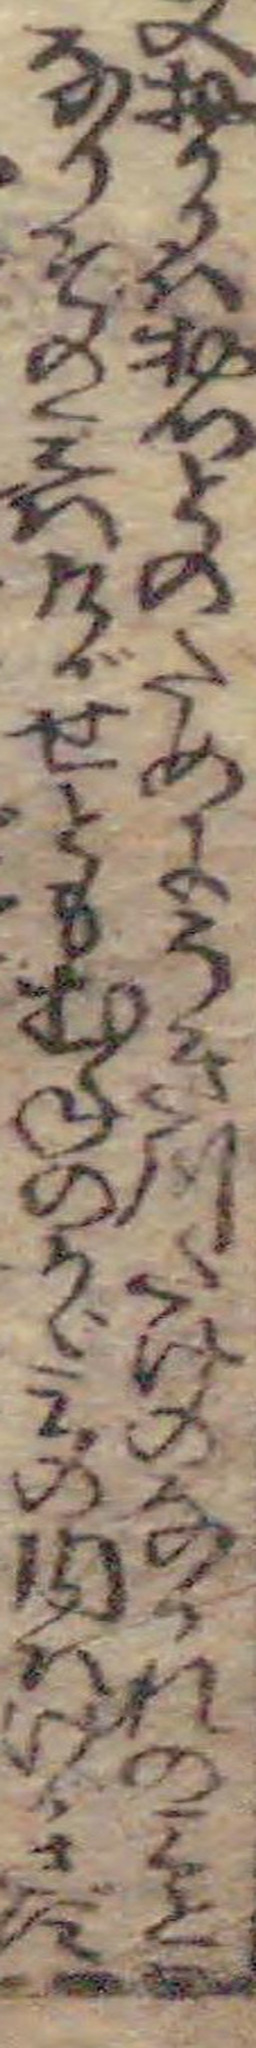なりそのみはけがせともむねのかゞみの内はけがさず
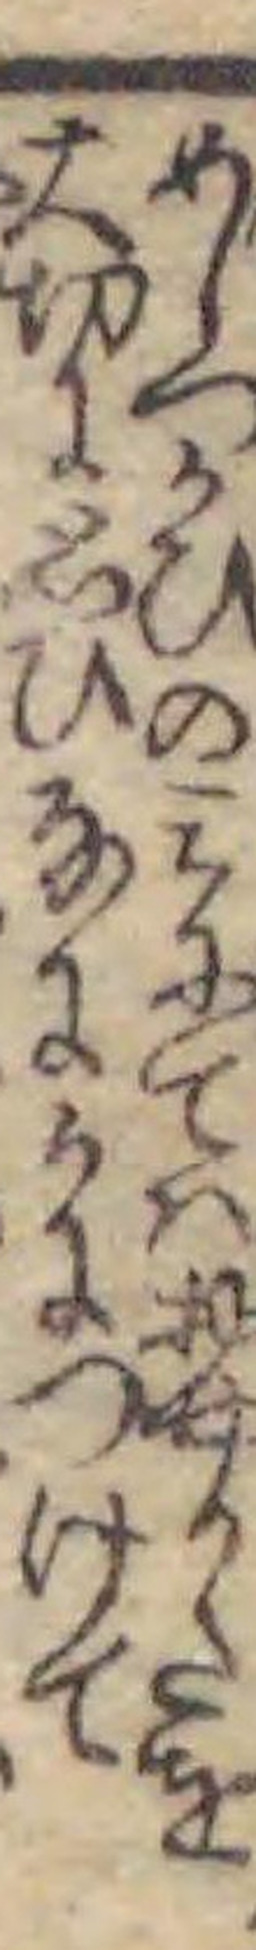大切に思ひなにかにつけて
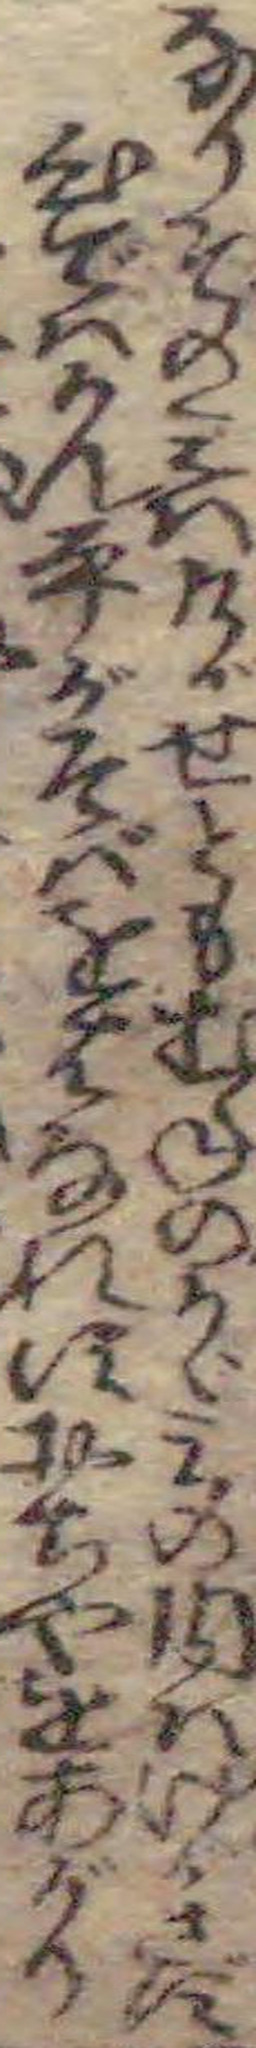心ではかん平がそばをはなれすおちやをあがり
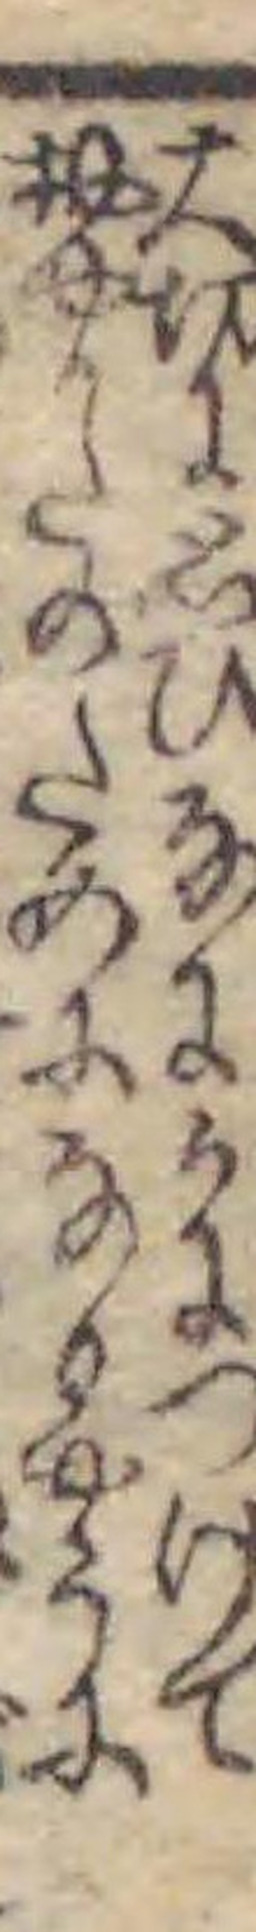おやかたのためになるやうに
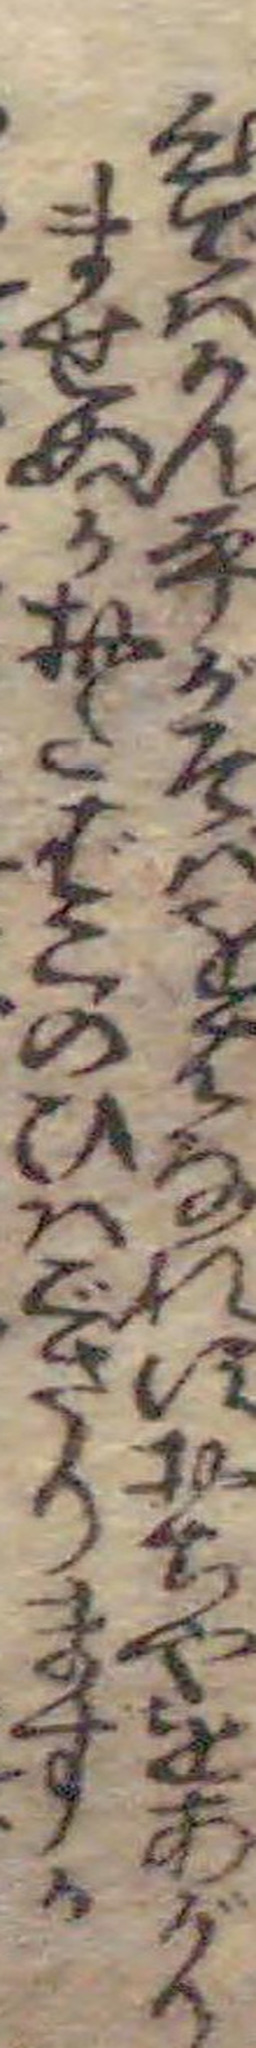ませぬかおたばこのひはごさりますか
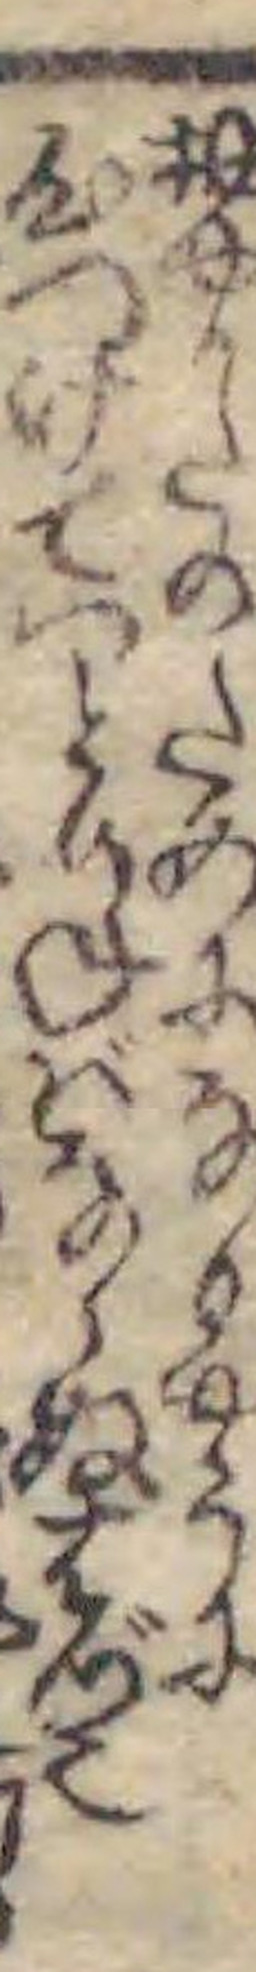心つけてつとめねばならぬはづ也
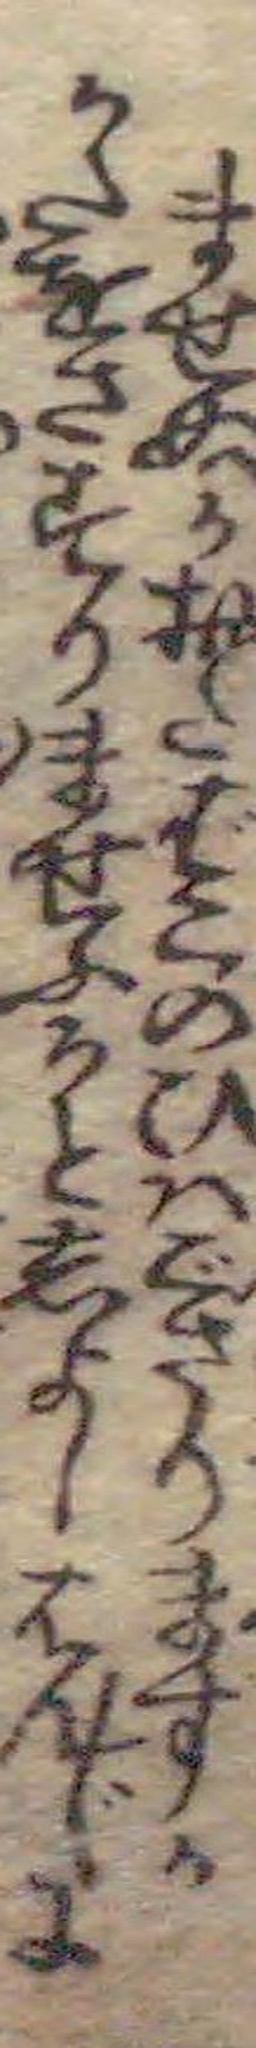かたをさすりませふかとしよしはんじに
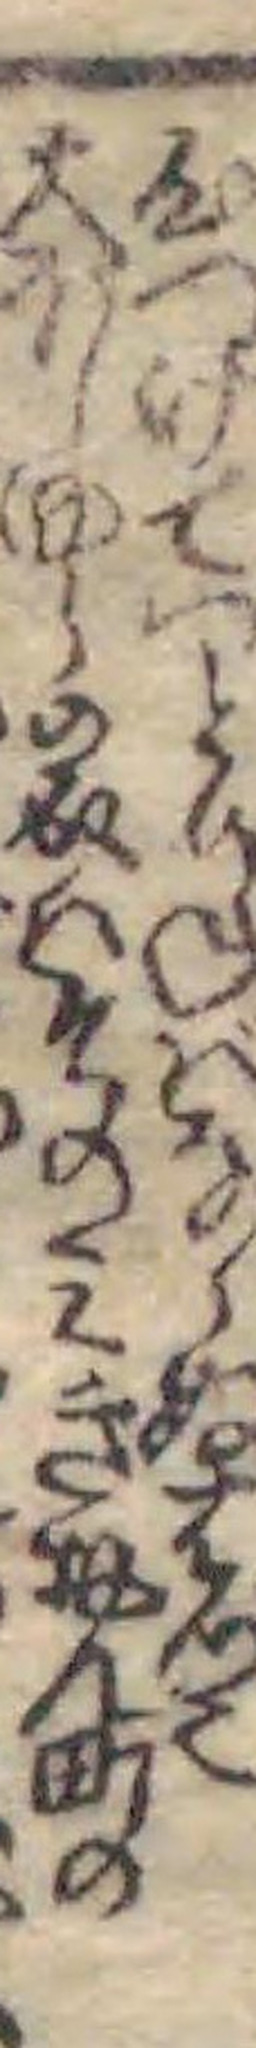大ほしゆらの介はそのみきおん町の
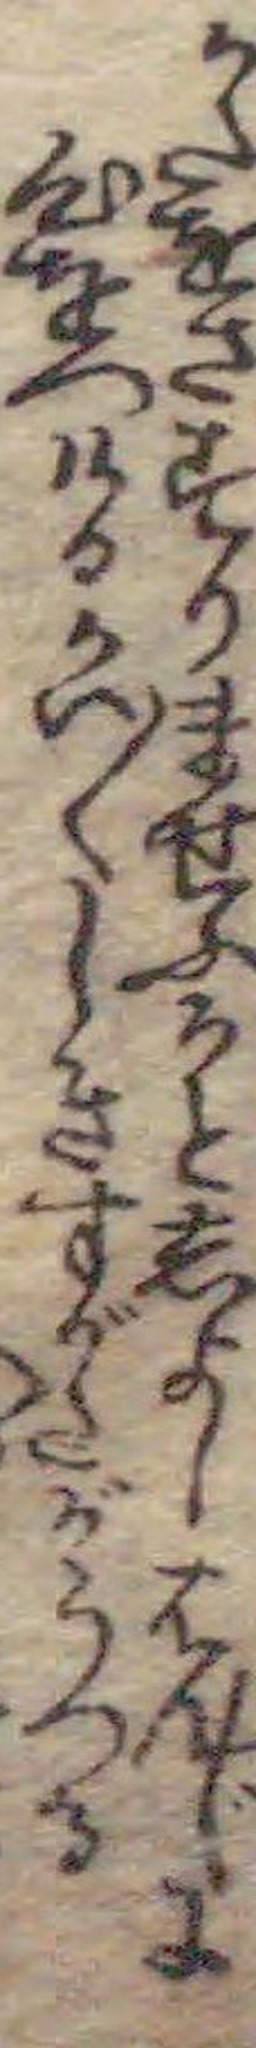心をつけるかい〳〵しきすがたがうつる
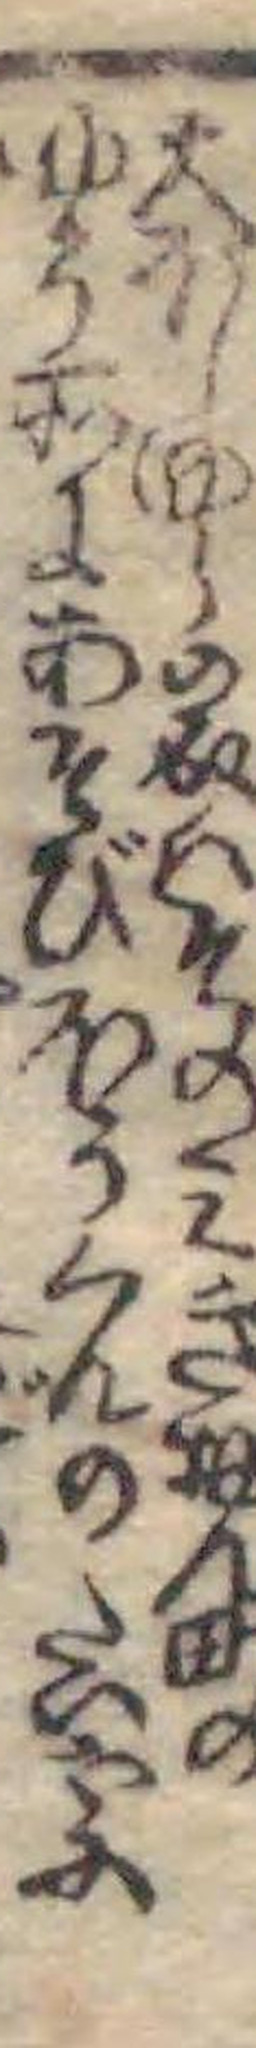ゆう所にあそびほうくんのたいやに
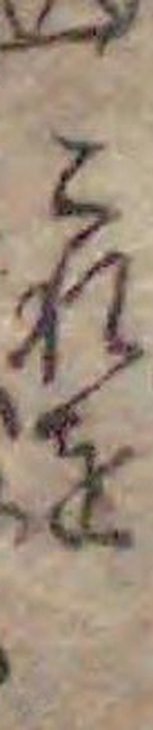これを
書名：人心鏡写絵 : 3巻
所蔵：国立国会図書館 National Diet Library, JAPAN
